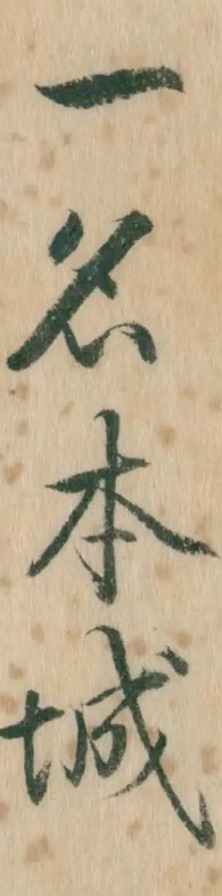一名本城
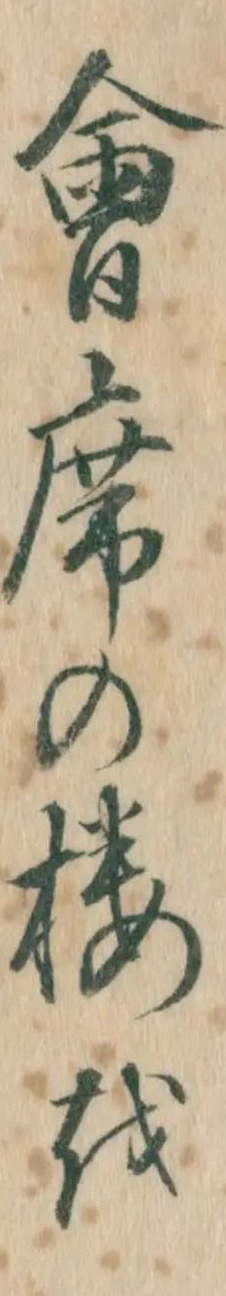会席の楼を
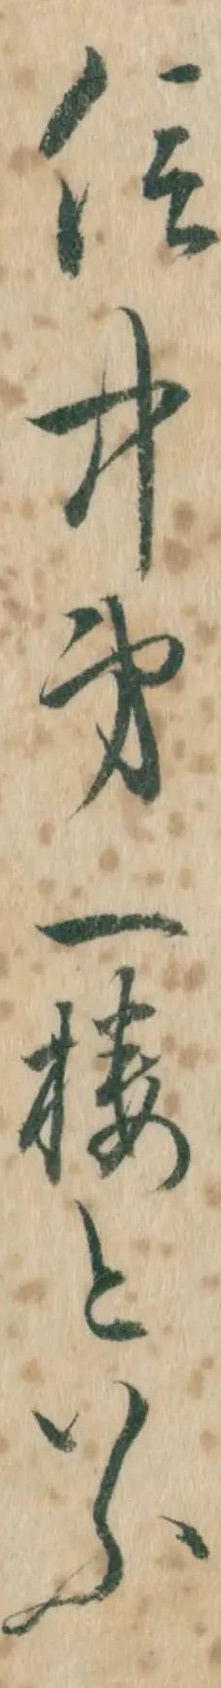信中第一楼といふ

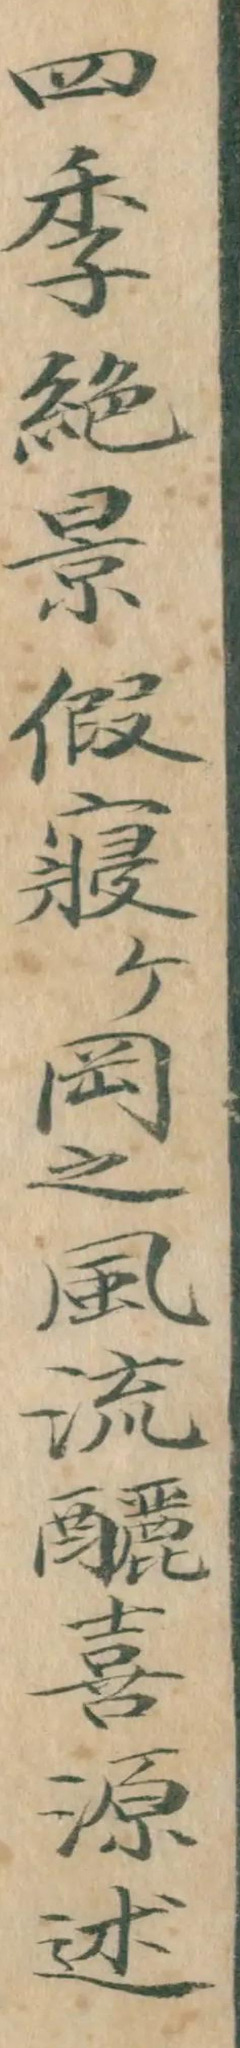四季絶景仮寝ヶ岡之風流釃喜源述
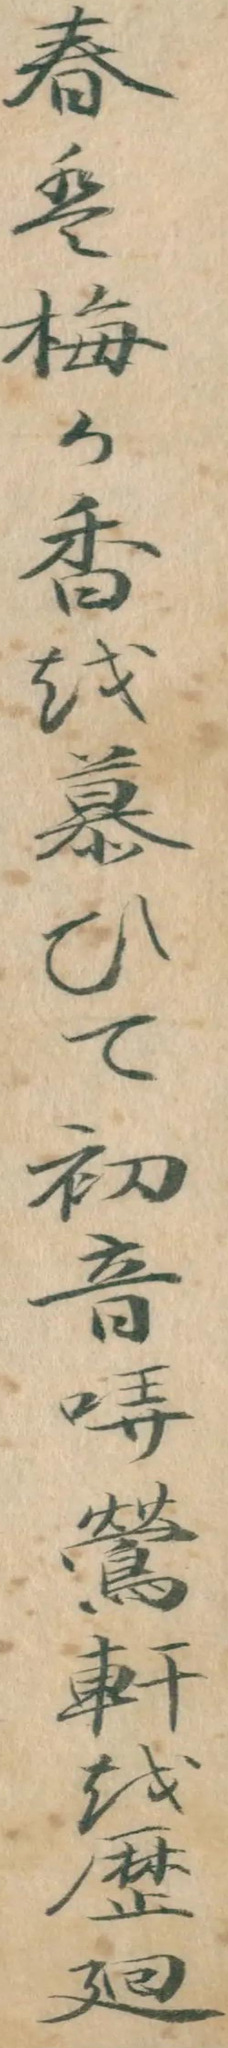春は梅か香を慕ひて初音哢鶯軒を歴廻
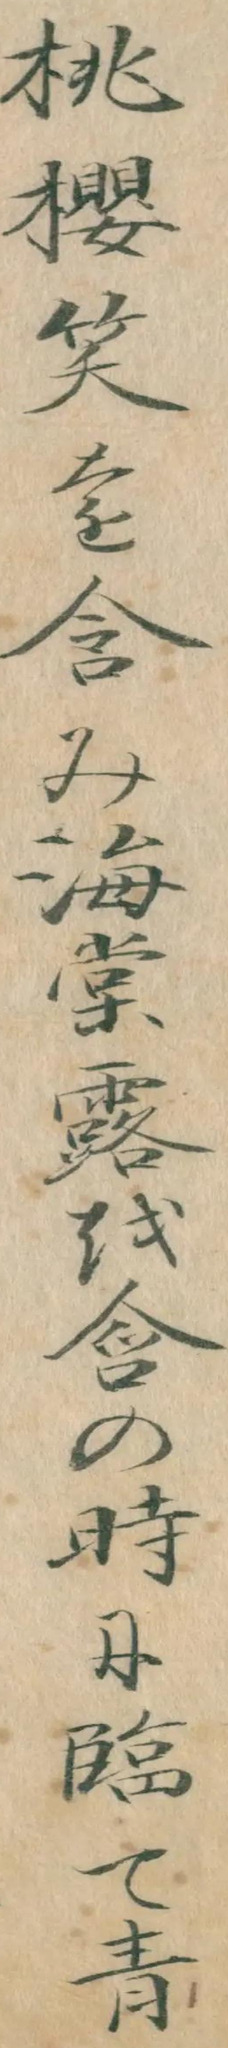桃桜笑を含み海棠露を含の時に臨て青
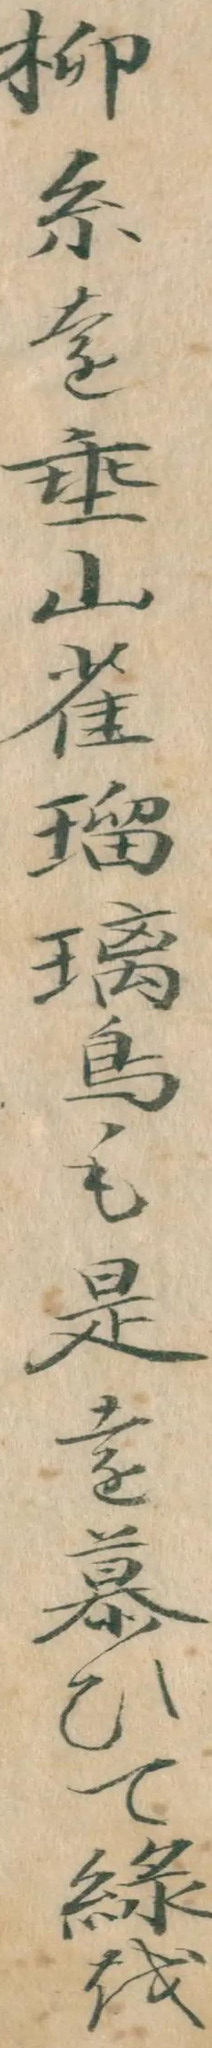柳糸を垂山雀瑠璃鳥も是を慕ひて緑を
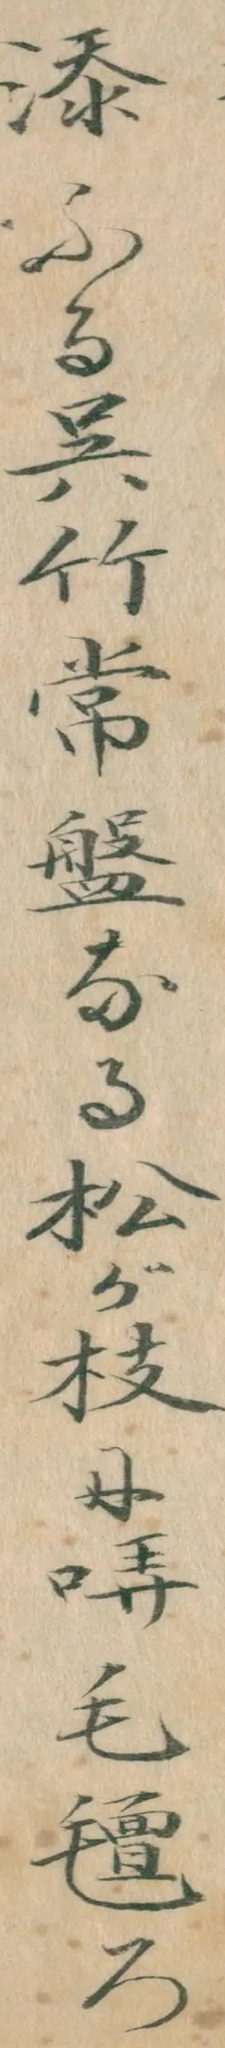添ふる呉竹常盤なる松が枝に哢毛氊ろ
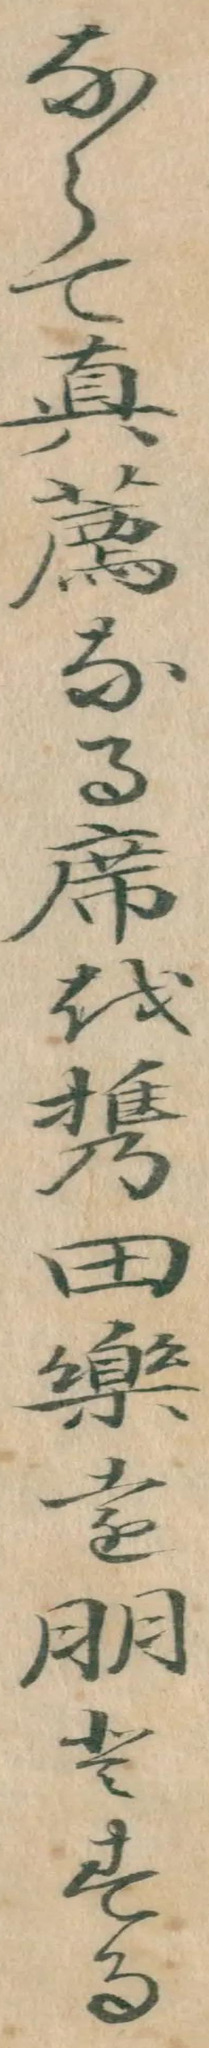なして真薦なる席を携田楽を朋とする
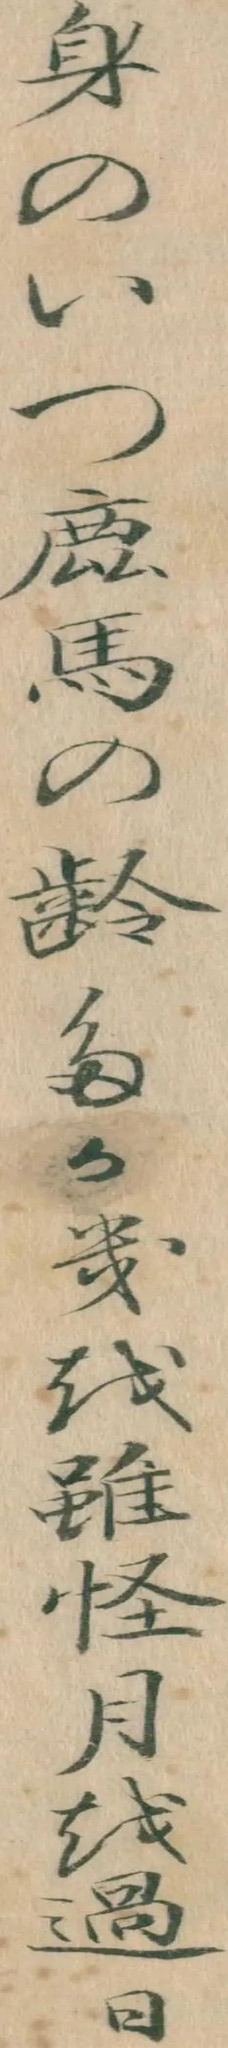身のいつ鹿馬の齢たかきを雖怪月を過日
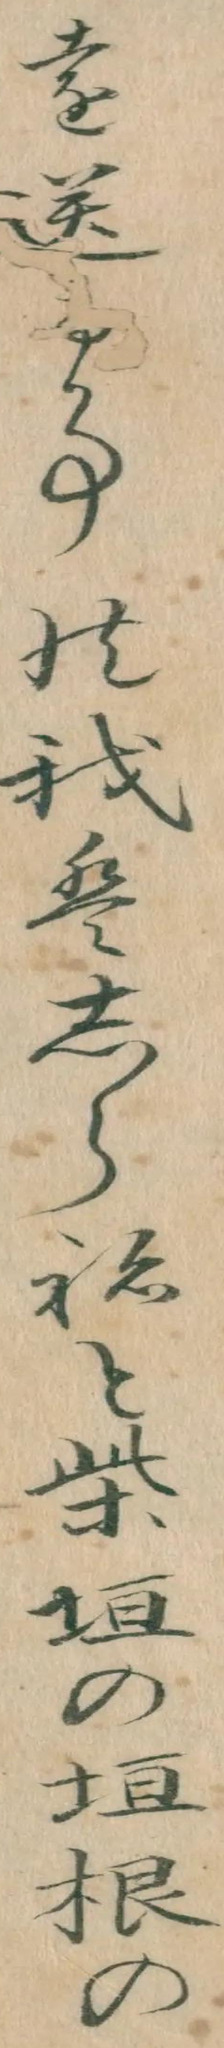を送事の我はしらねと柴垣の垣根の
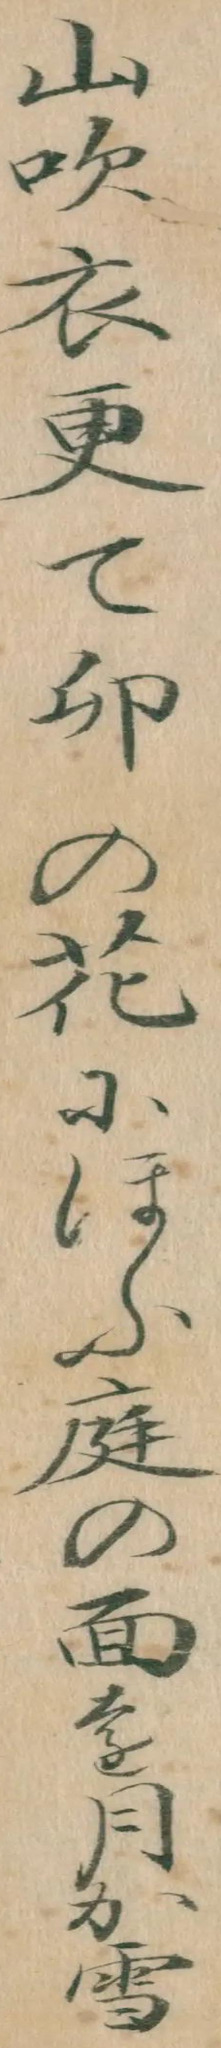山吹衣更て卯の花にほふ庭の面を月か雪
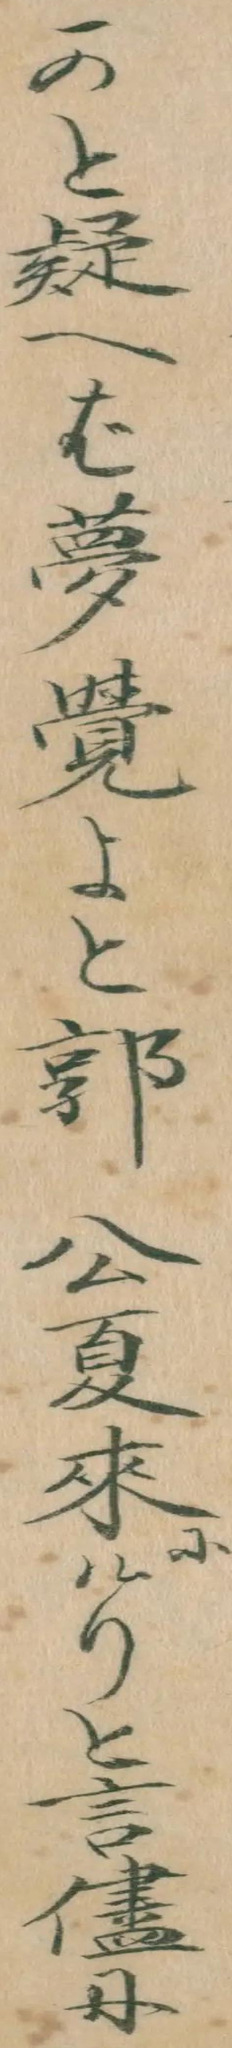かと疑へは夢覚よと郭公夏来にけりと言儘に
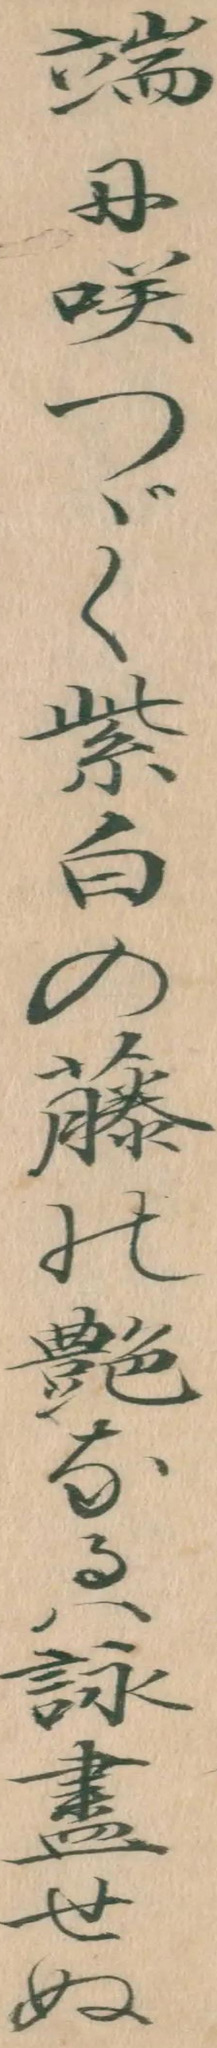端に咲つゞく紫白の藤の艶なるは詠尽せぬ
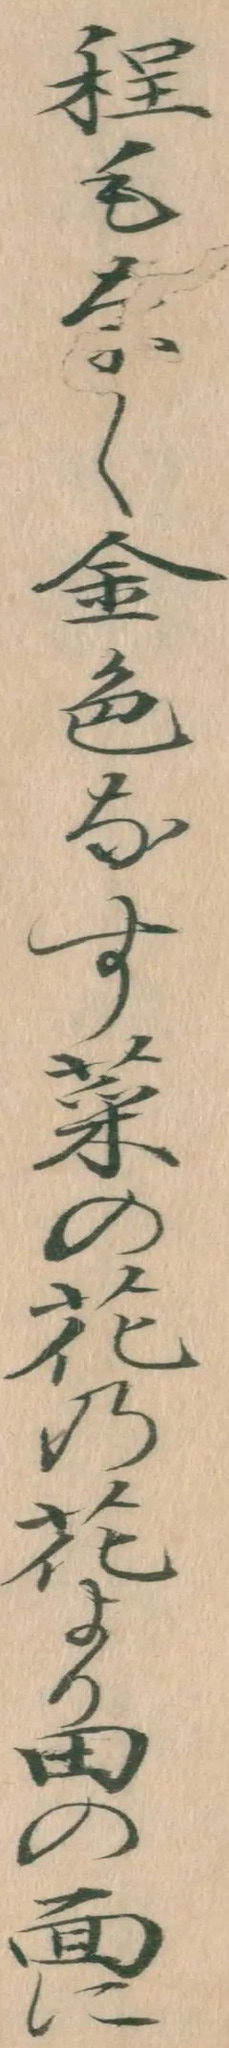程もなく金色なす菜の花の花より田の面に
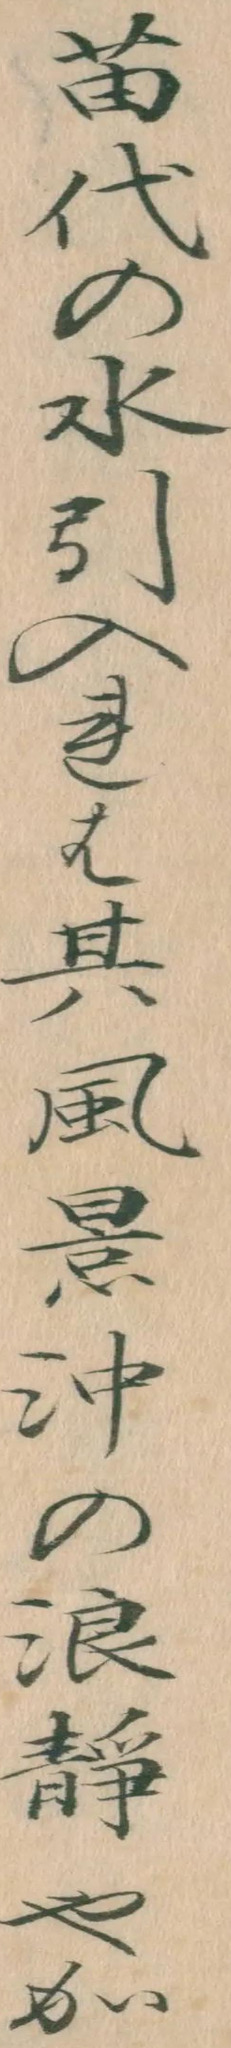苗代の水引入れは其風景沖の浪静やか
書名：俗語之種. [3]
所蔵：国立国会図書館 National Diet Library, JAPAN
